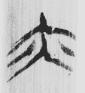亦
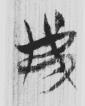弗
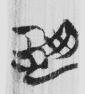{巩又}
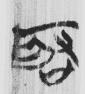啟
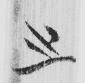之
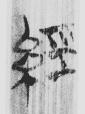經
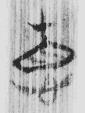惪
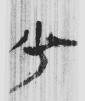少
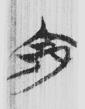命
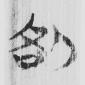咎
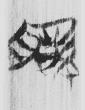䌛
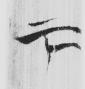下
